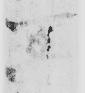五
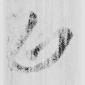㠯（以）
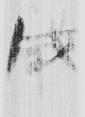成
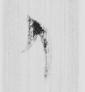人
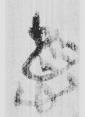惪
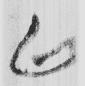㠯（以）
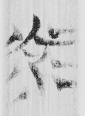光
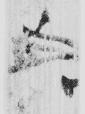之
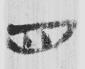四
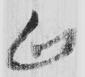㠯（以）
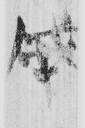成
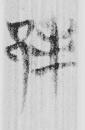邦
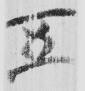五
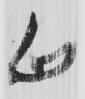㠯（以）
